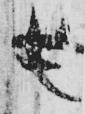弋（代）
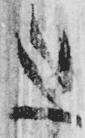之
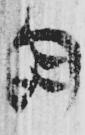含（今）
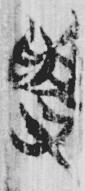受（紂）
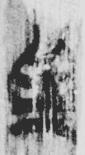爲
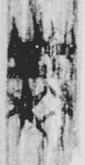無
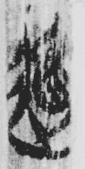道
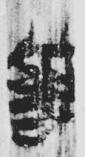○（昏）
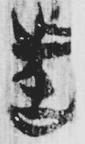者（諸）
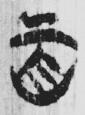百
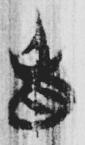眚（姓）
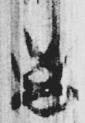至
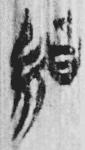約
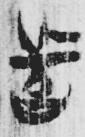者（諸）
